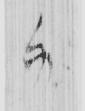力
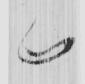㠯（以）
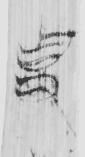史
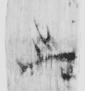之
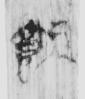飢
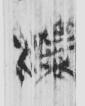滐
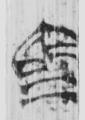寒
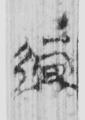{尸几日}
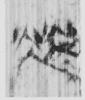{炎衣}
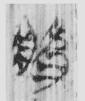{爿兔}
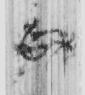和
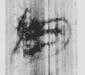於
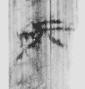亓
